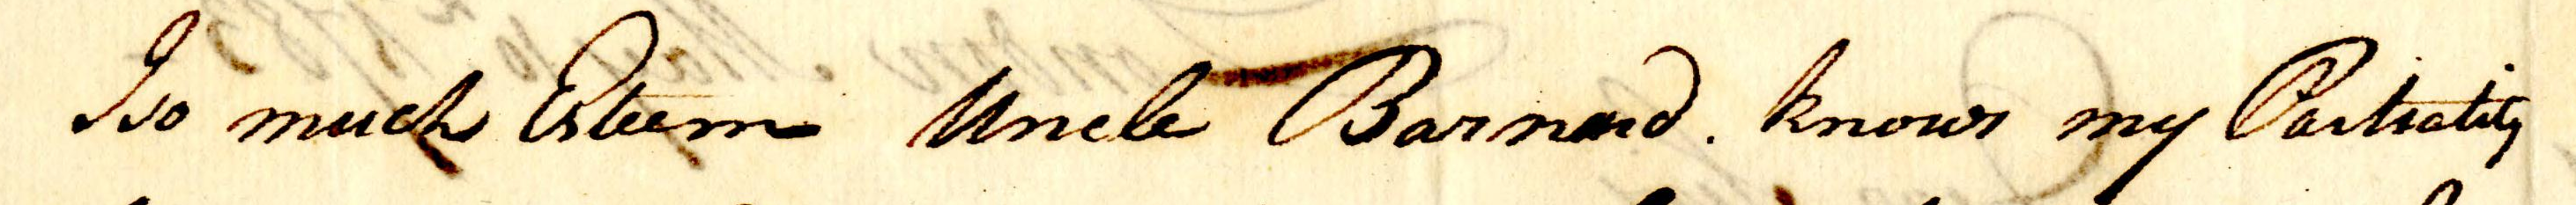I so much Esteem Uncle Barnard. knows my Partiality
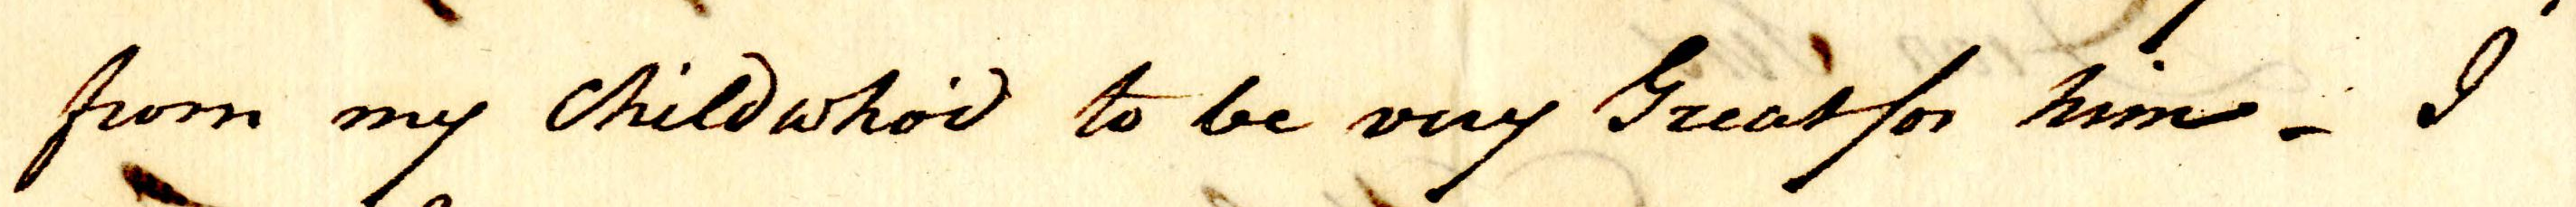from my child who'd to be very great for him.- I
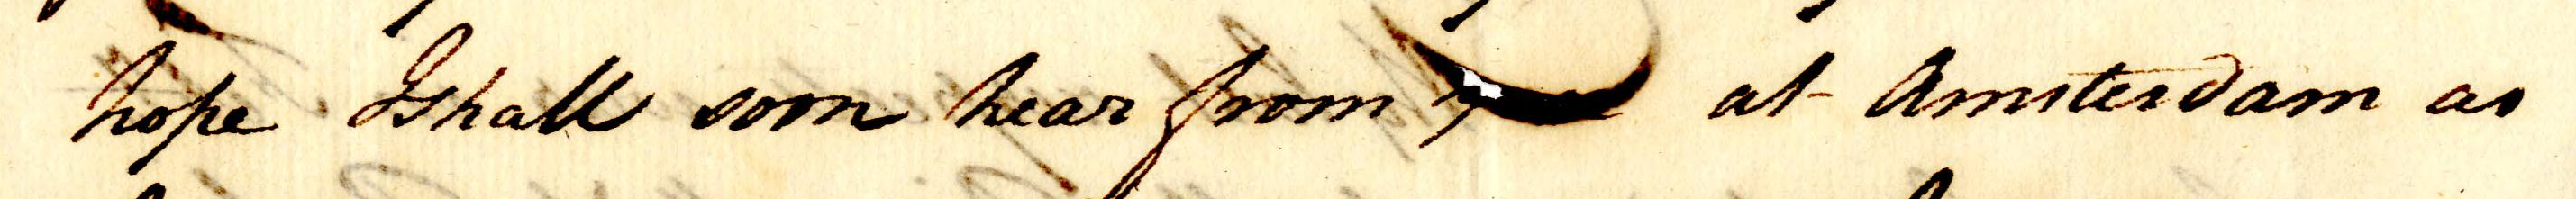hope I shall soon hear from [you] at Amsterdam as
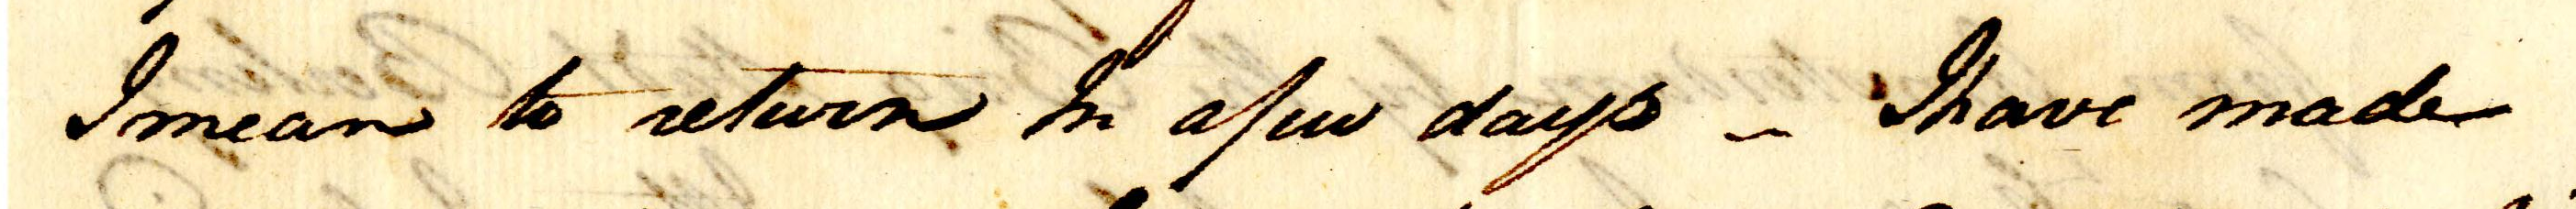I mean to return in a few days- I have made
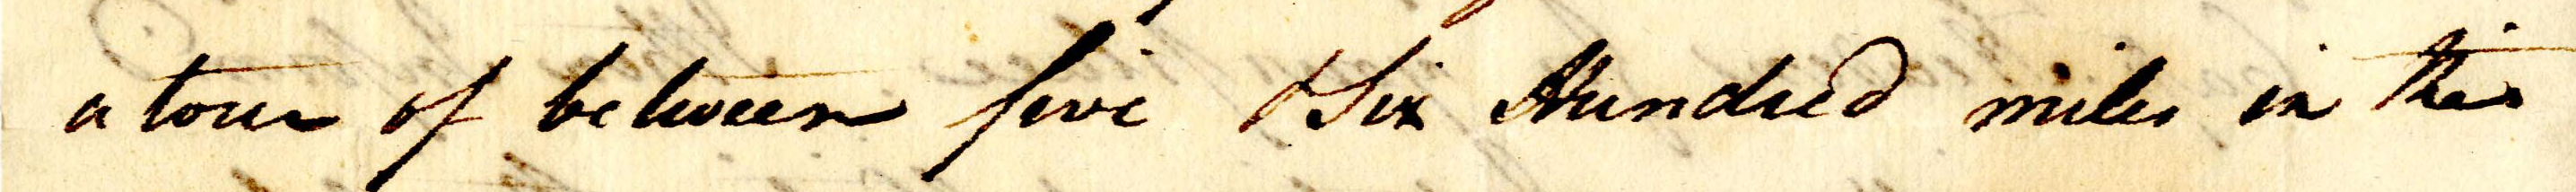a tour of between five & six Hundred miles in this
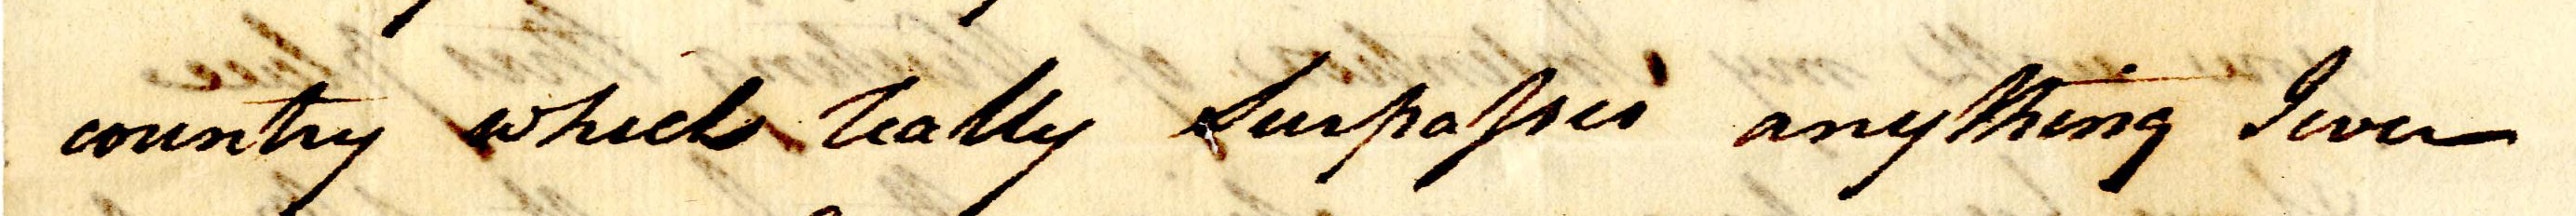country which really surpassed anything I ever
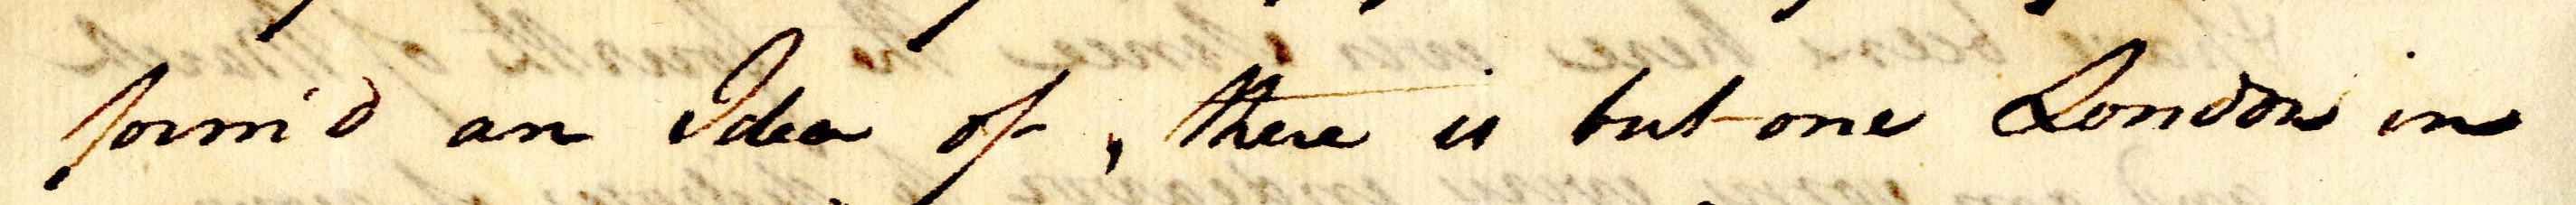form'd an idea of, there is but one London in
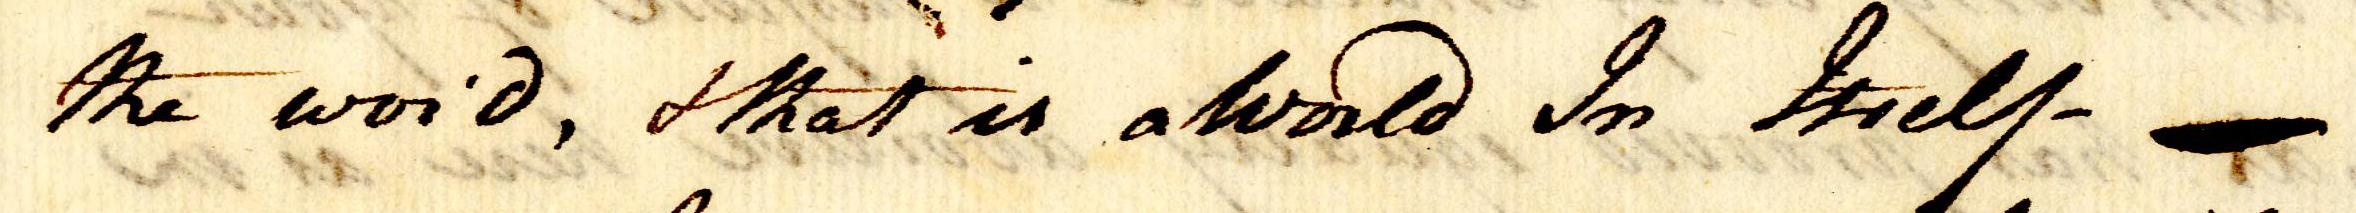the wor'd, & that is a world In Itself.-
